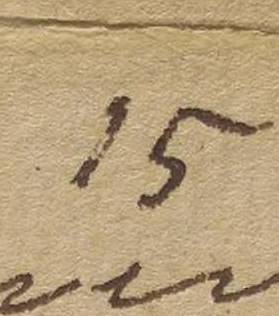15
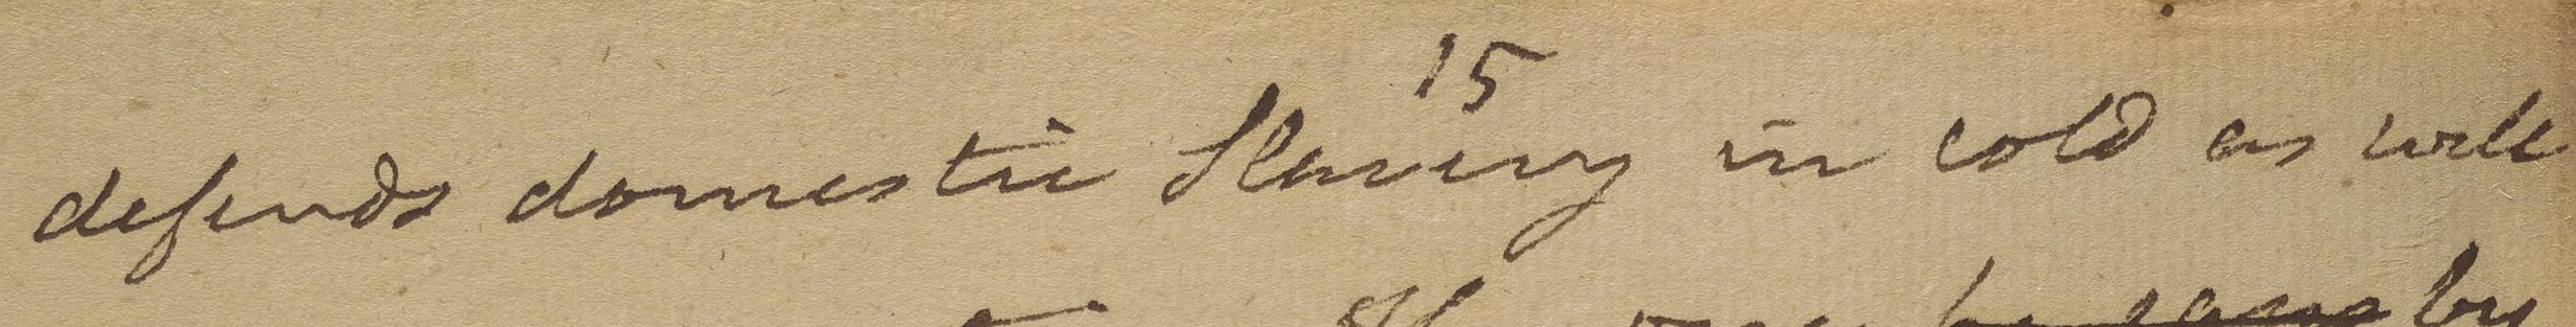defends domestic slavery in cold as well
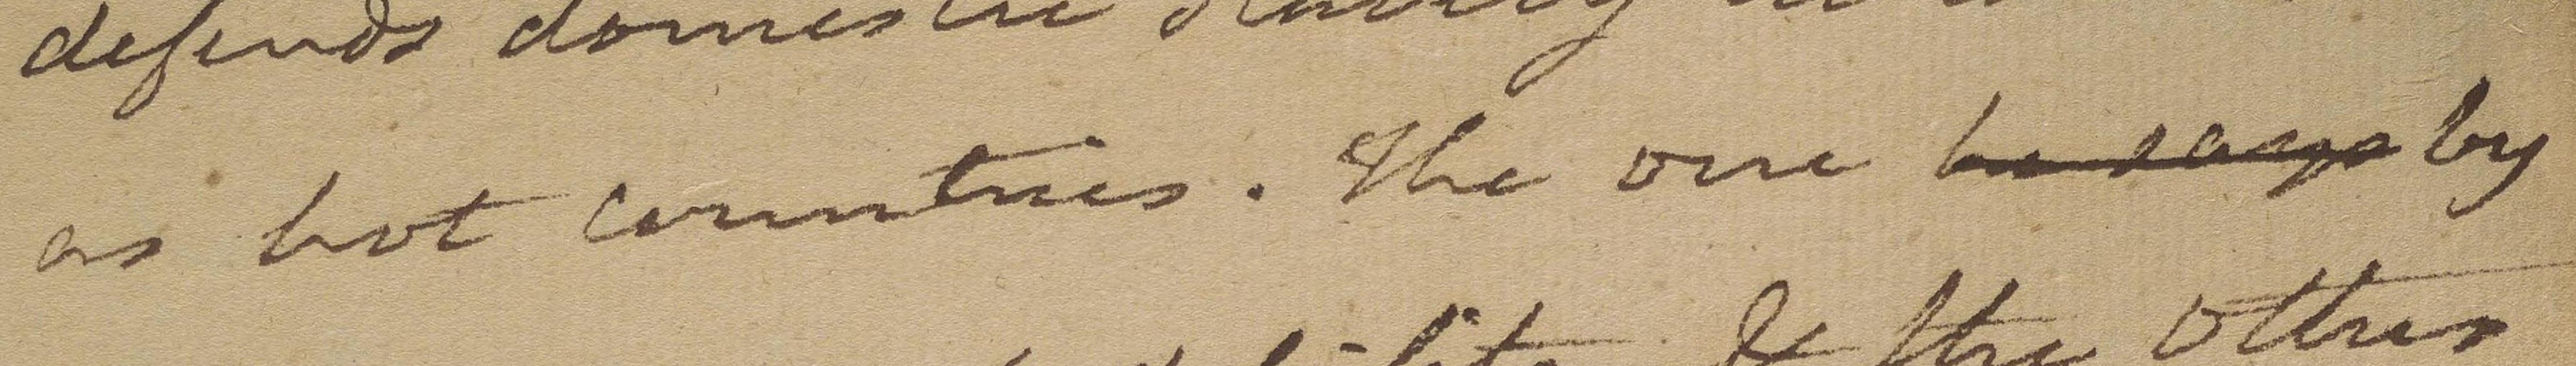as hot countries. The one [he says] by
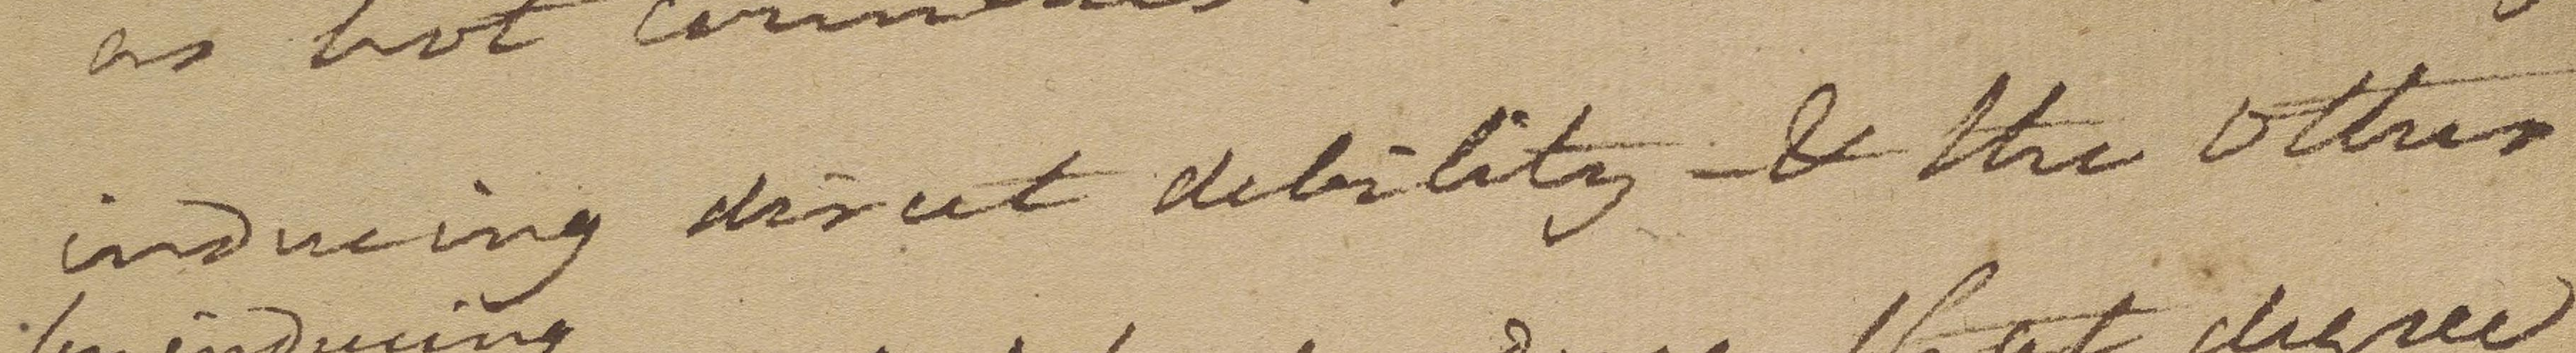inducing direct debility & the others
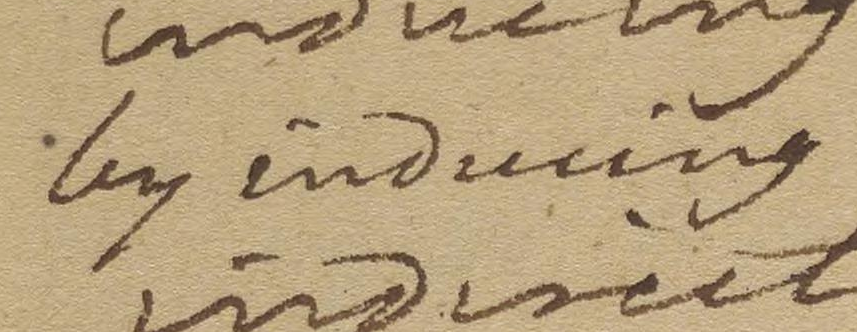by inducing
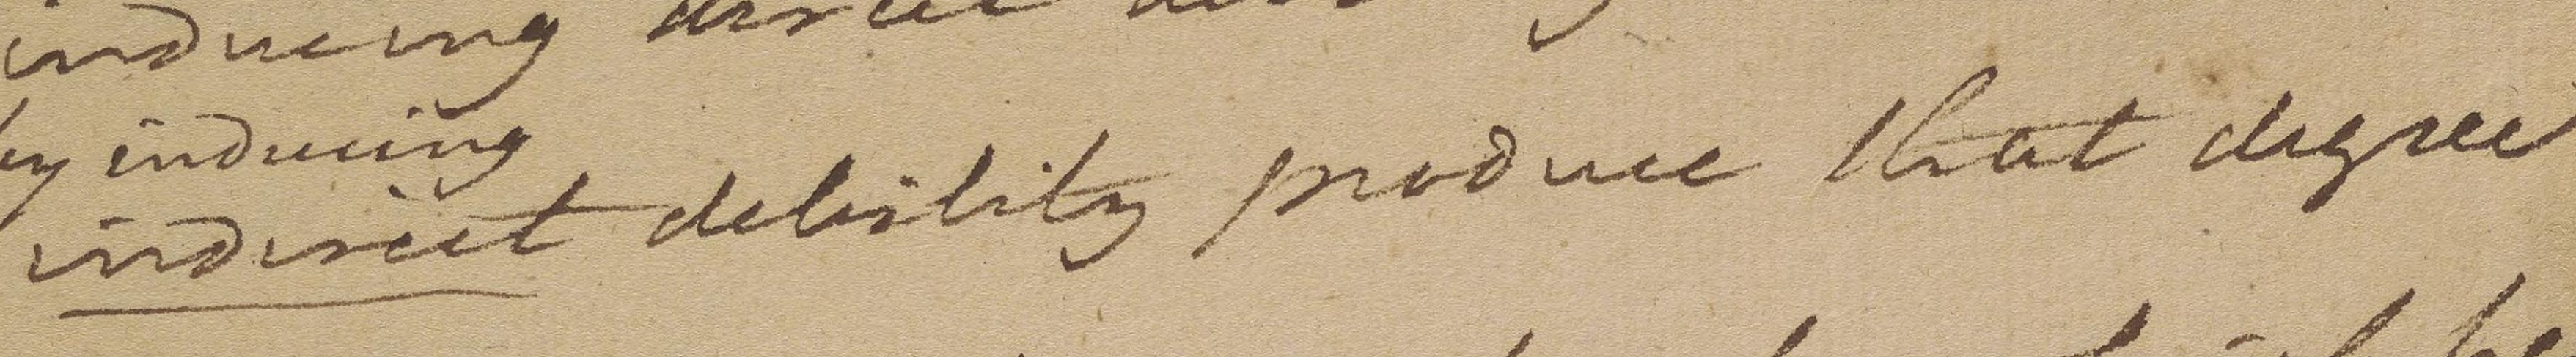indirect debility produce that degree
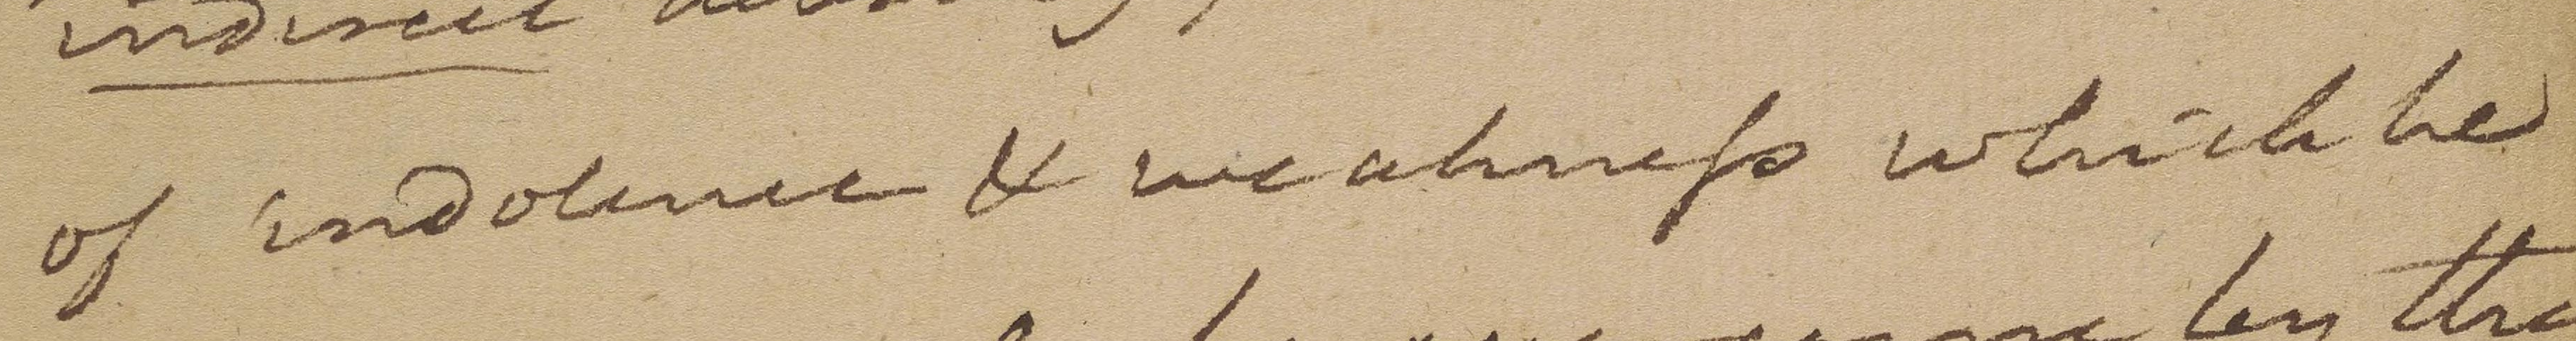of indolence & weakess which he
